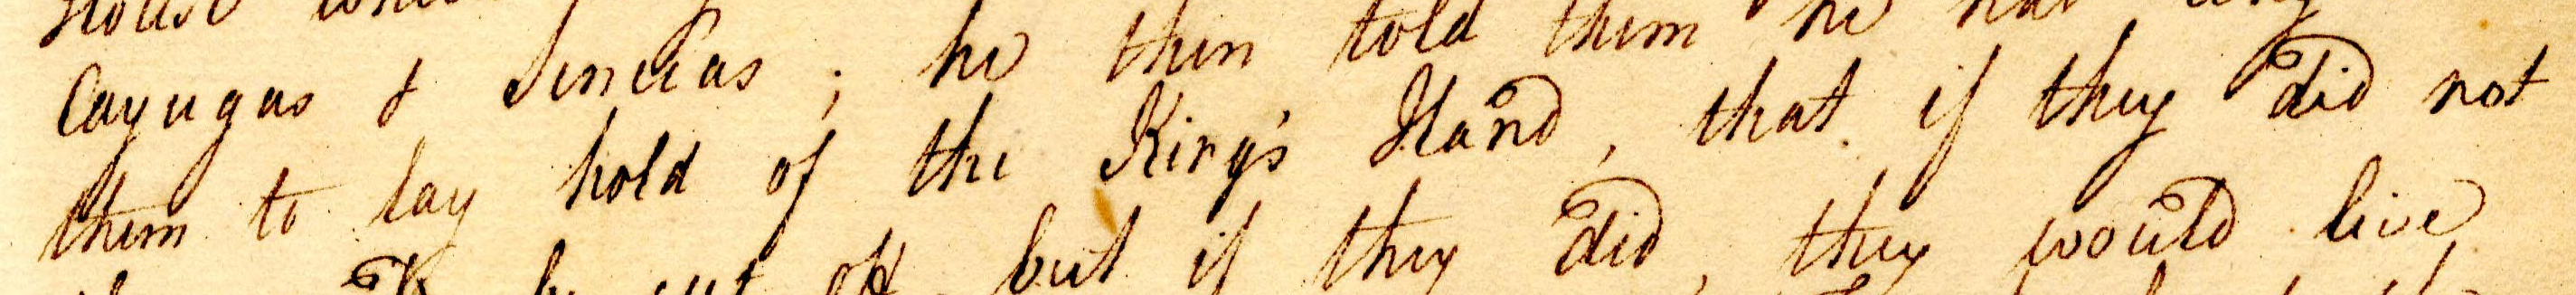them to lay hold of the King's Hand, that if they did not
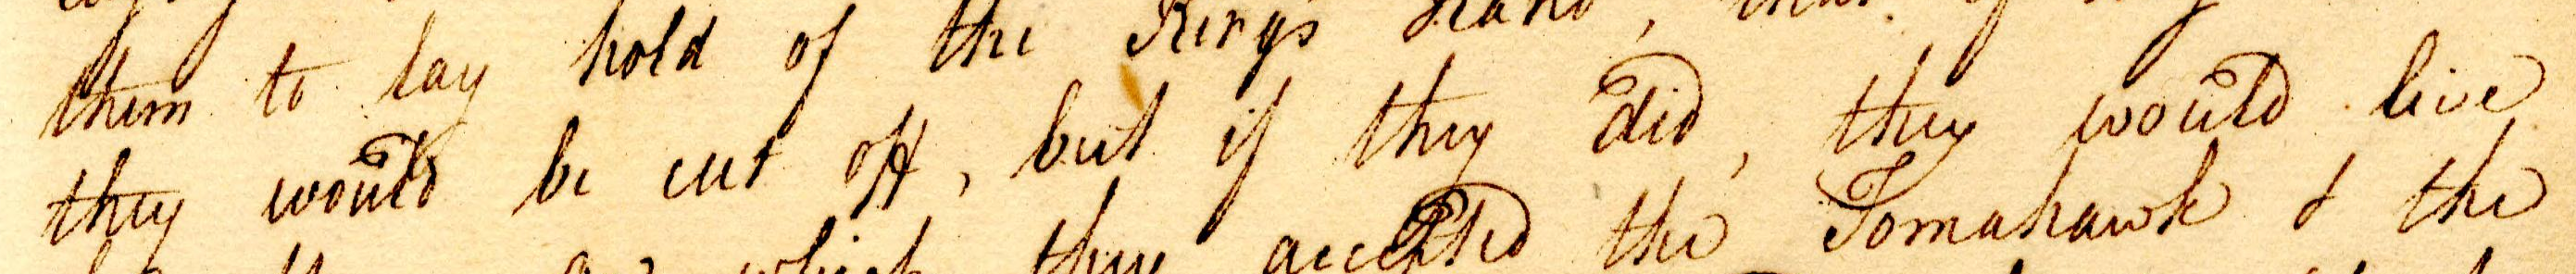they would be cut off, but if they did, they would live
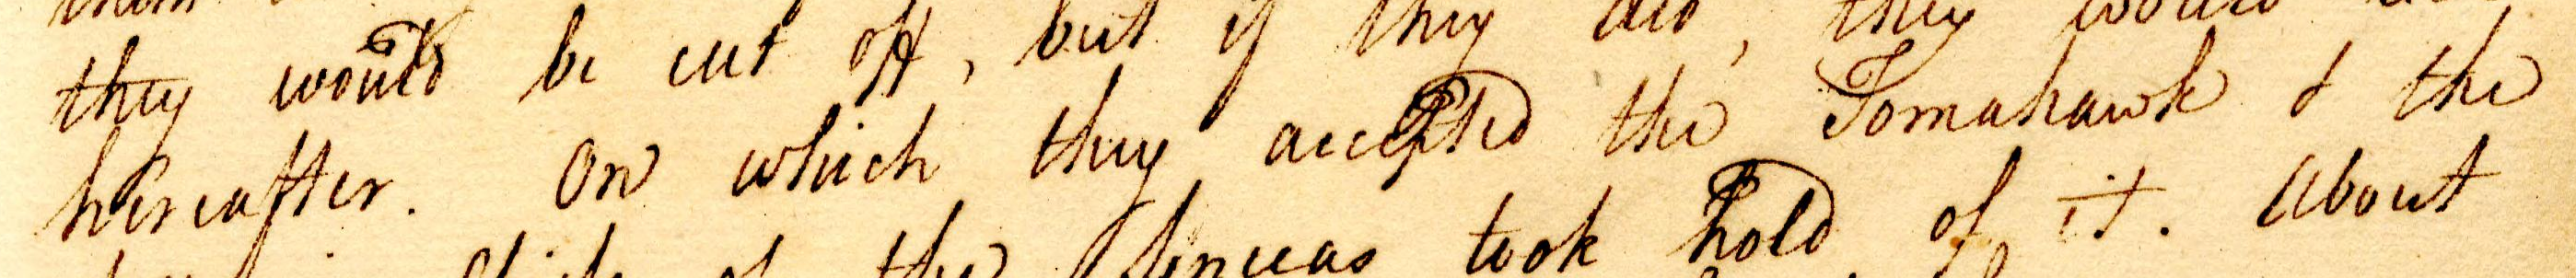hereafter. On which they accepted the Tomahawk & the
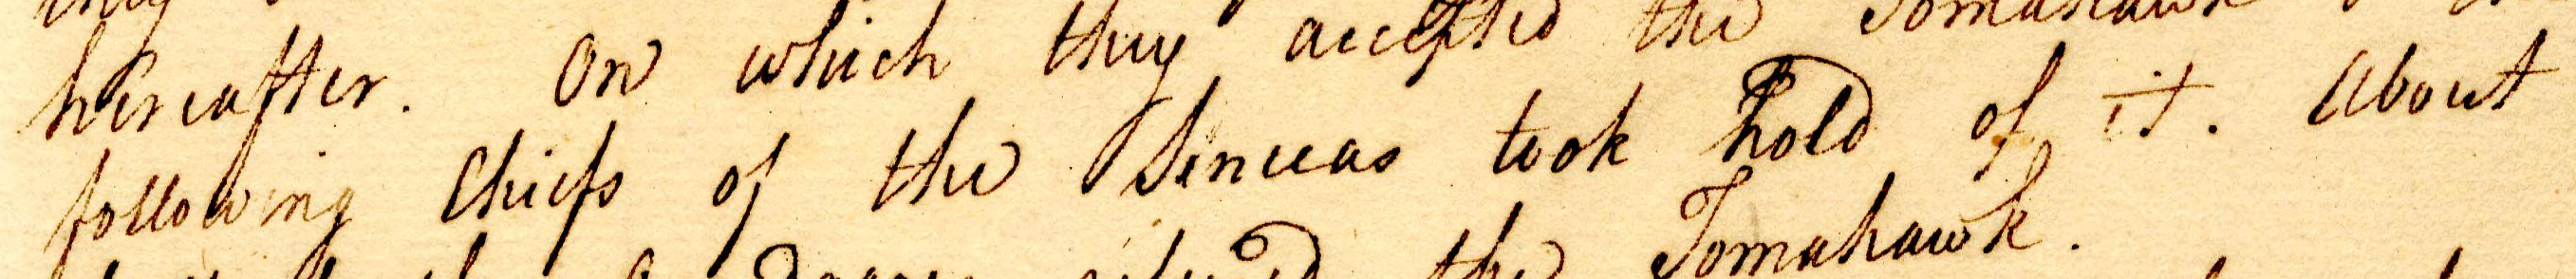following Chiefs of the Senecas took hold of it. About
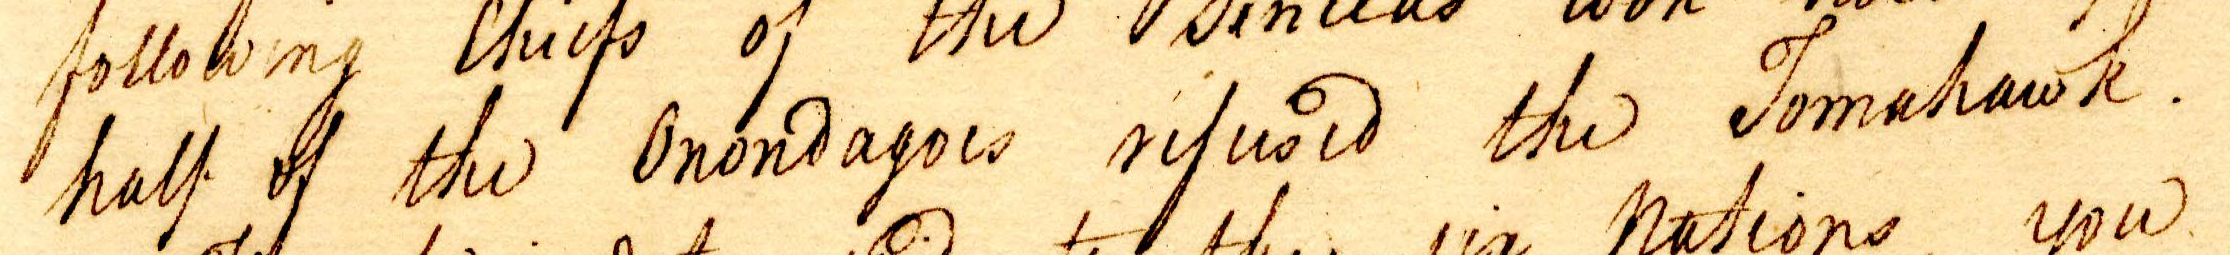half of the Onondagoes refused the Tomahawk.
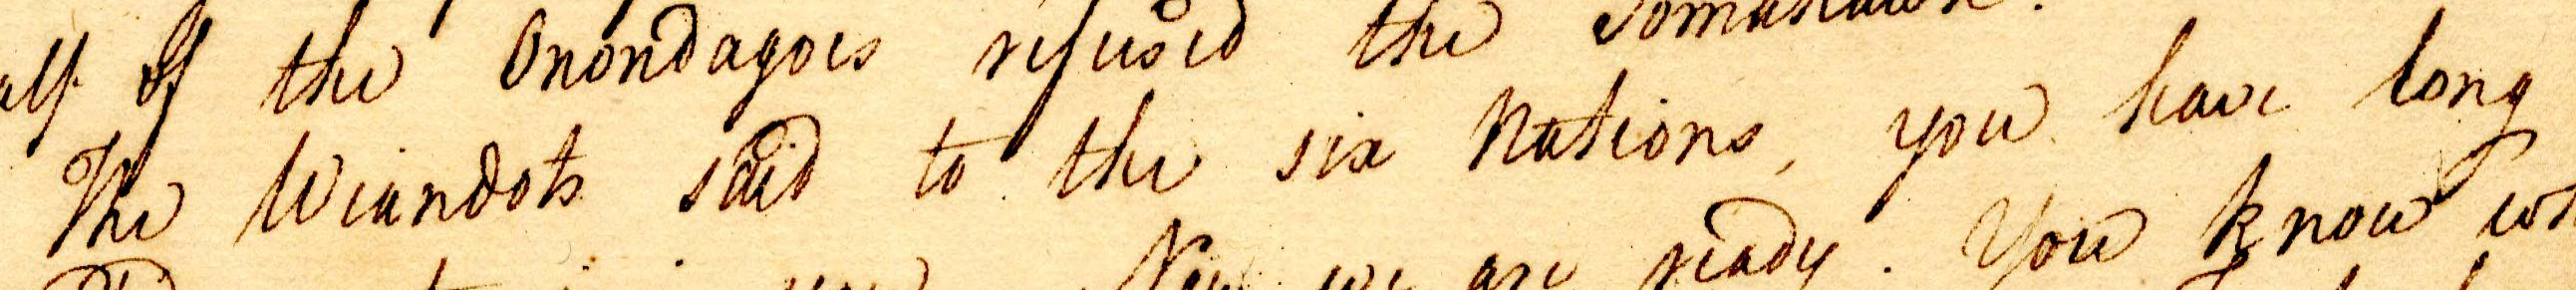The Wiandots said to the six nations, you have long
